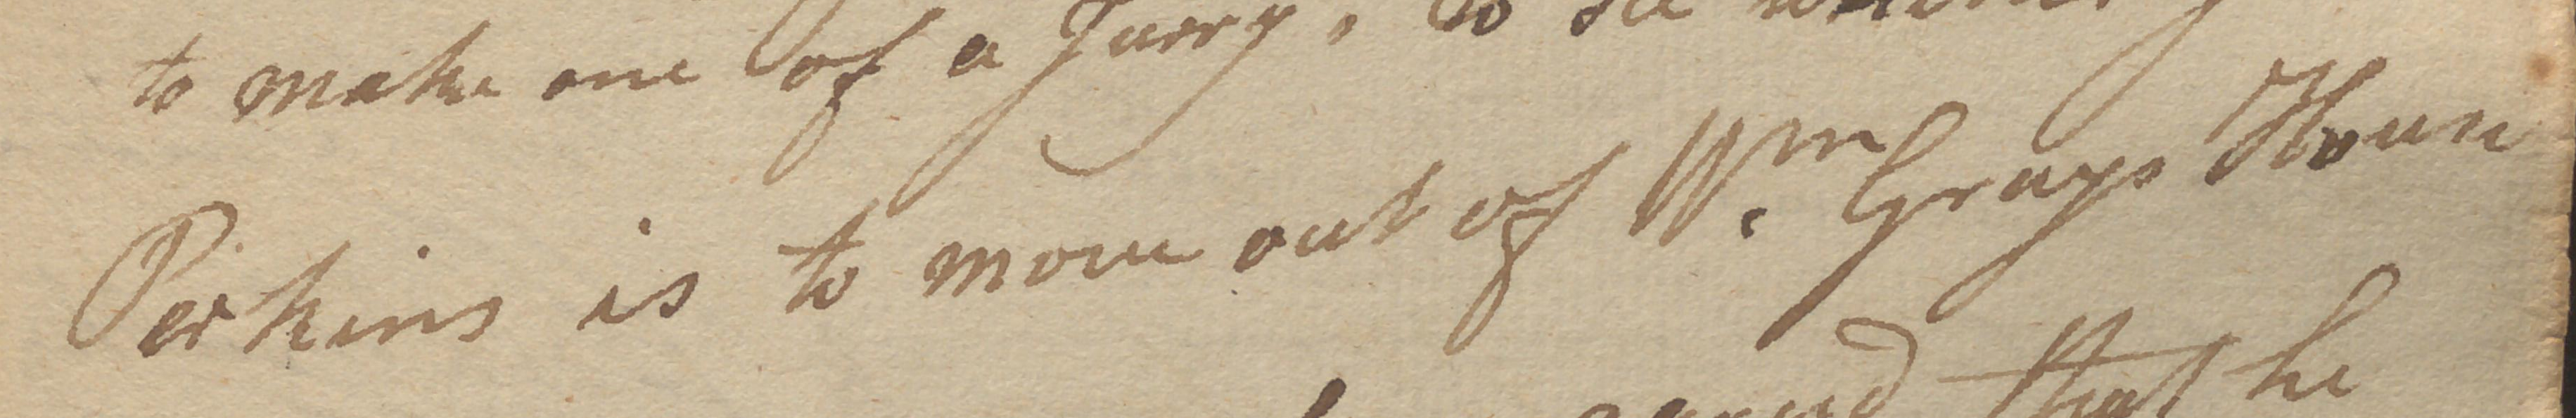Porkins is to move out of W^m. Grays House
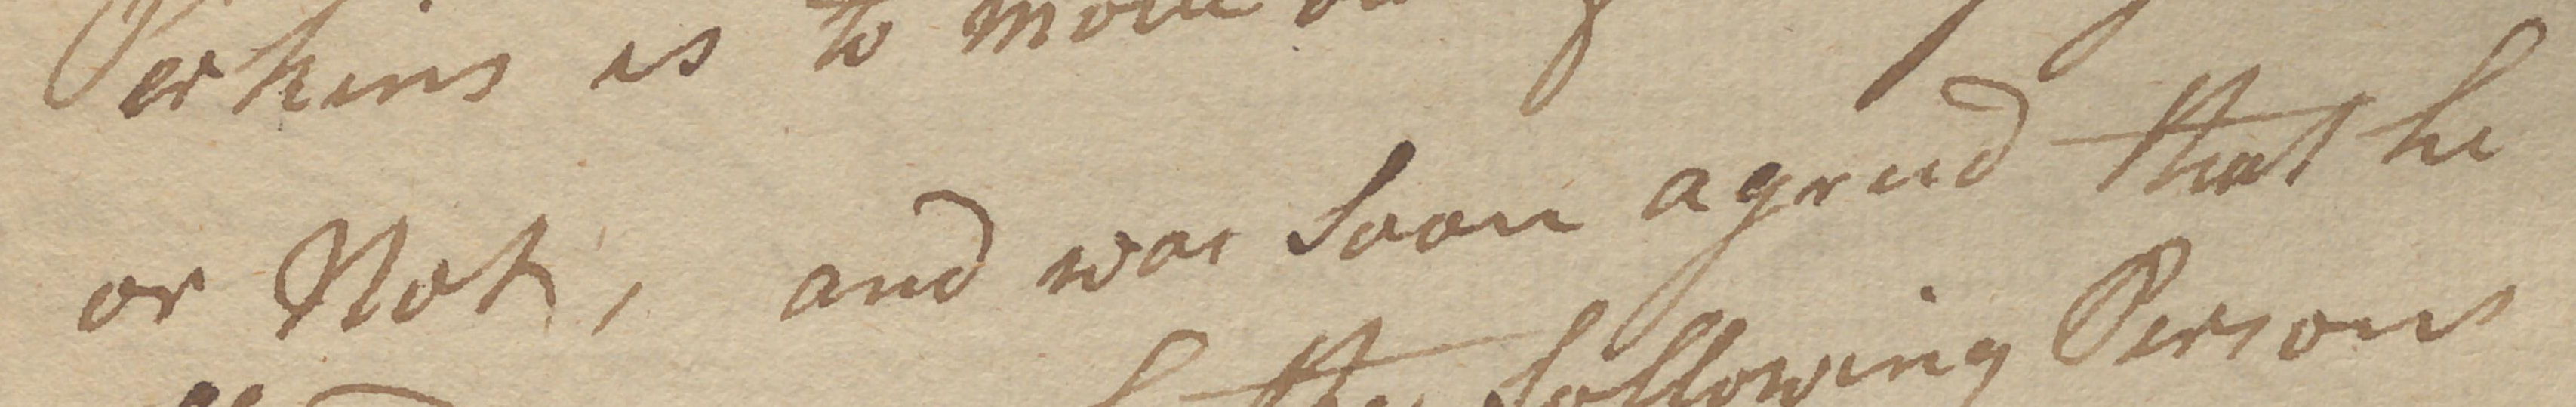or Not, and was soon agreed that he
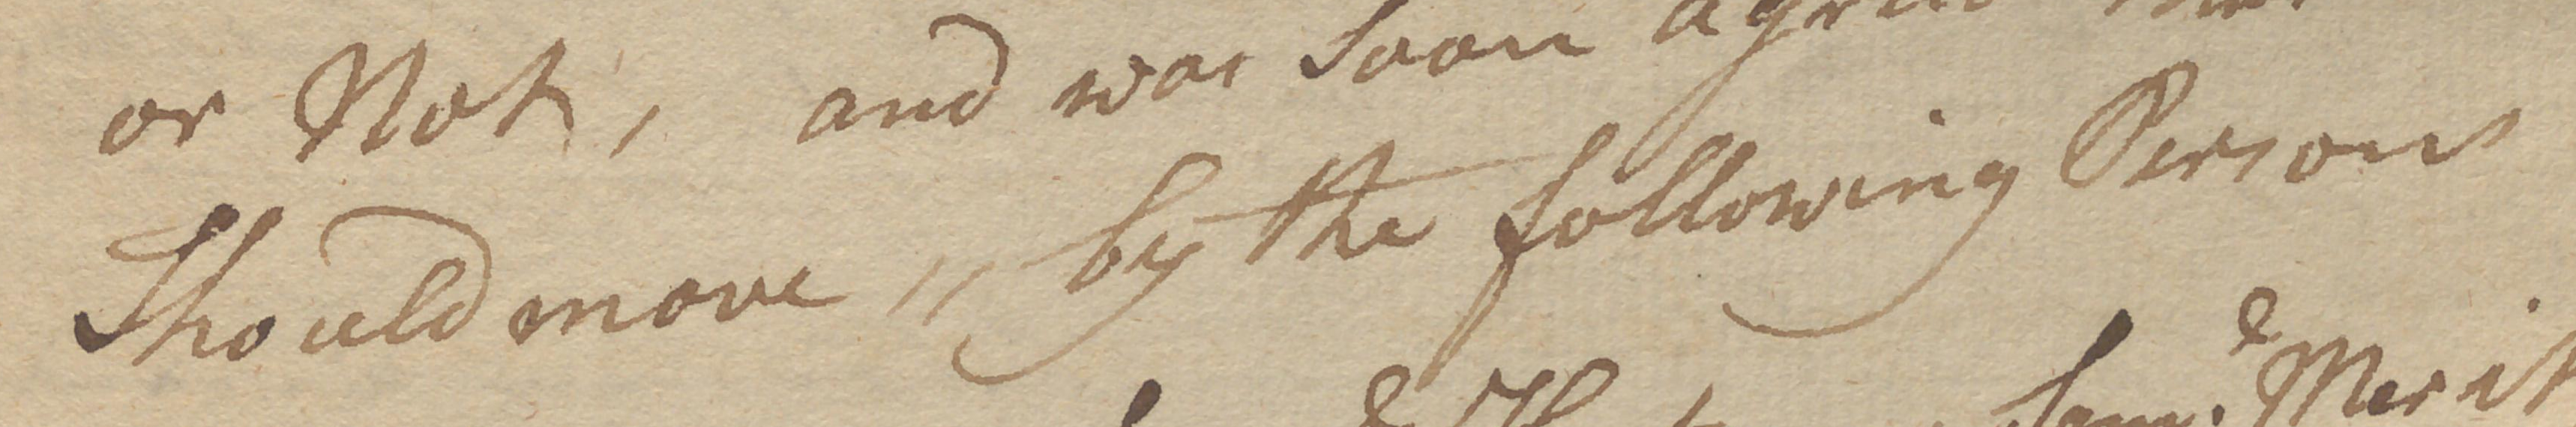should move, by the following Persons
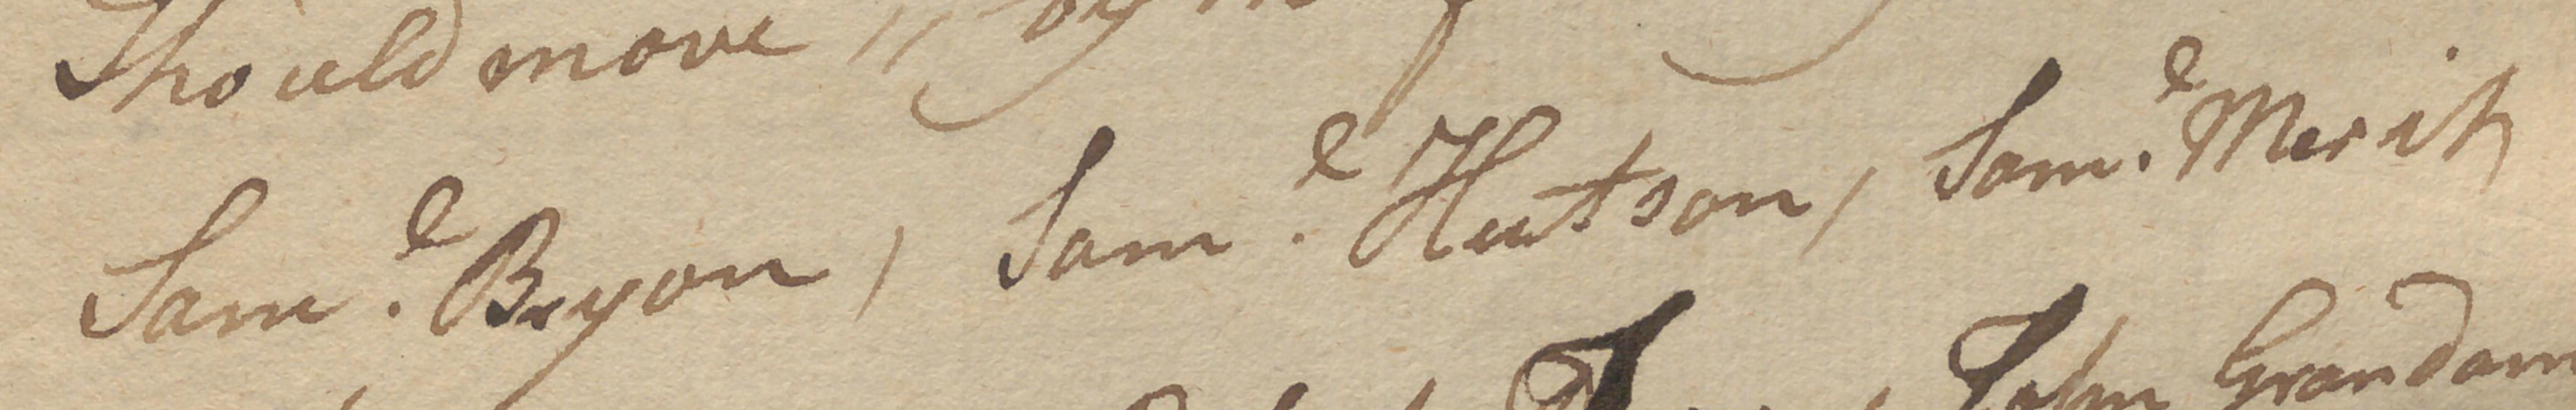Sam^l. Bryon, Sam^l. Hutson, Sam^l. Merit
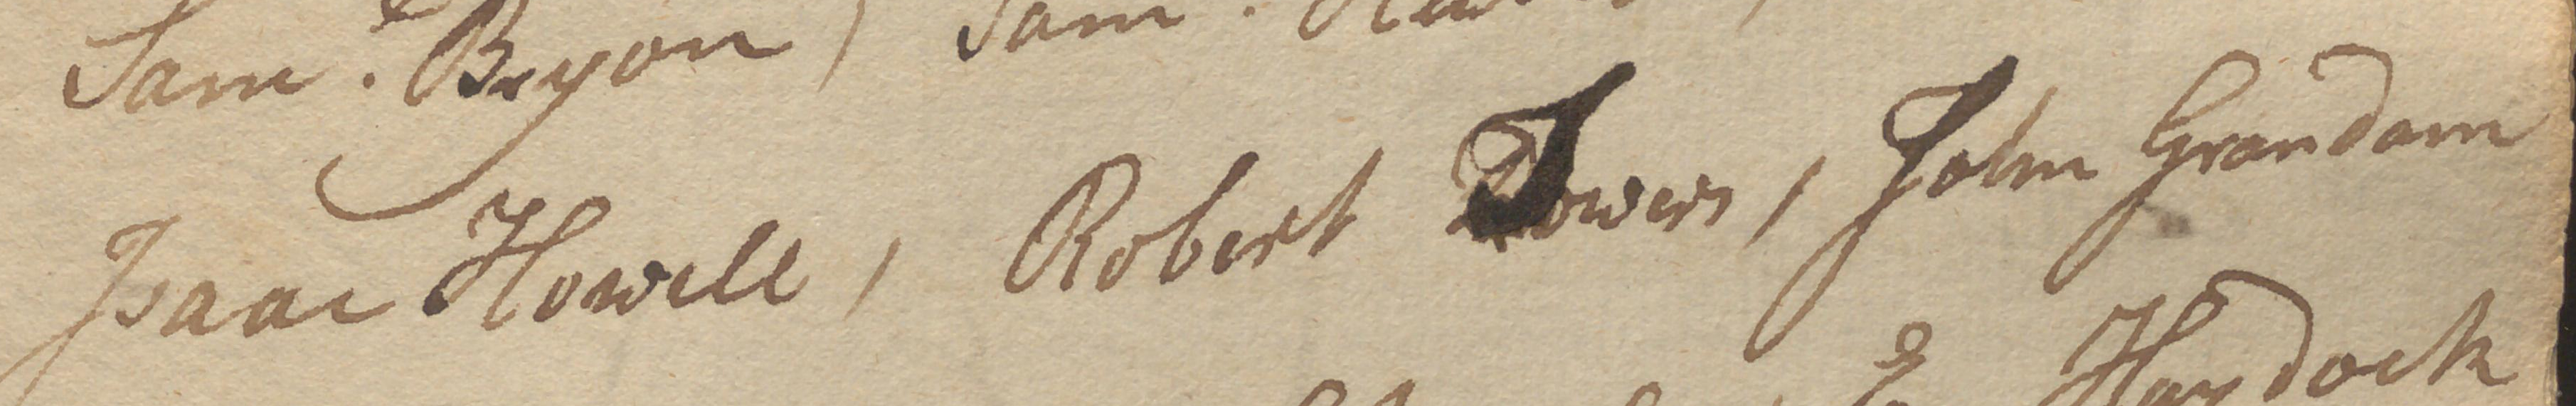Isaac Howell, Robert Towers, John Grandam
